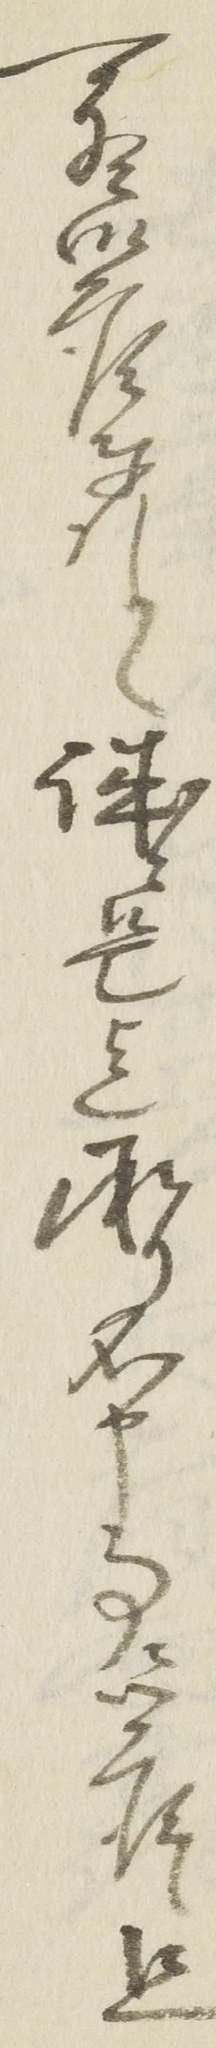可有御座奉存候殊ニ是迄承り不申事ニ御座候且
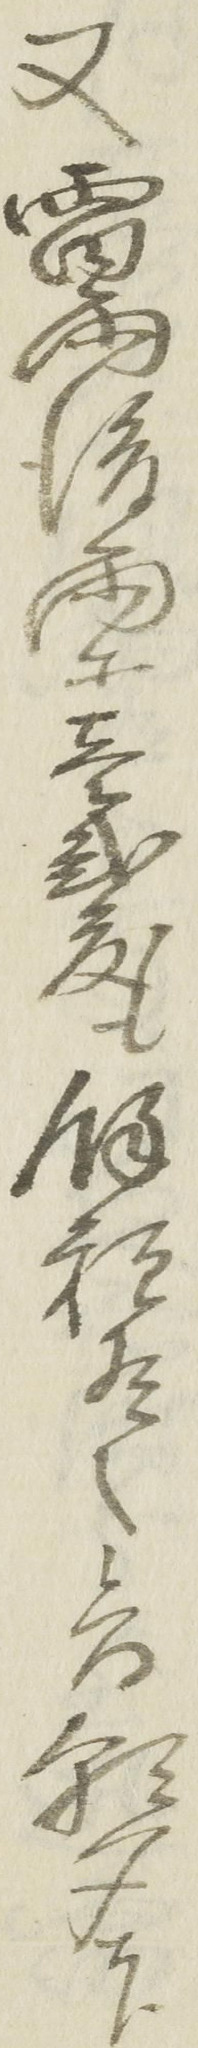又雷雨後雨等壱弐度も余程有之候間朝夕者
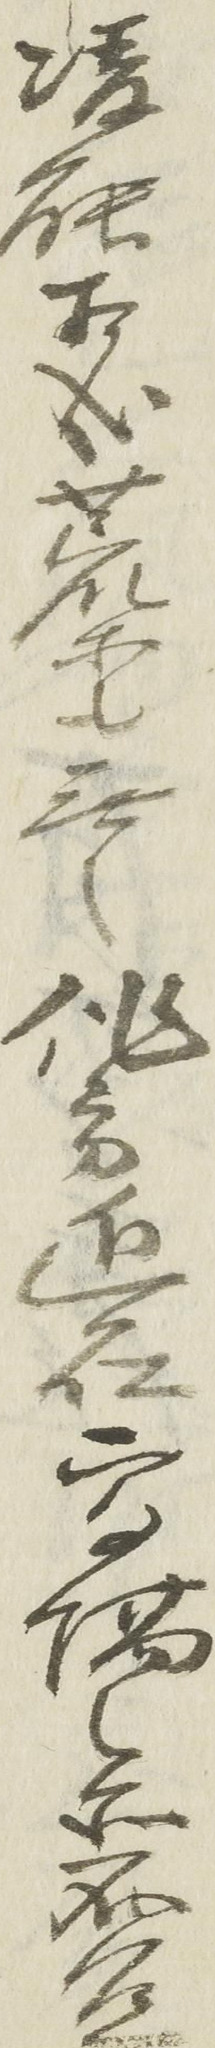凌能相成荒等も無之作方近在宿場之所不宜
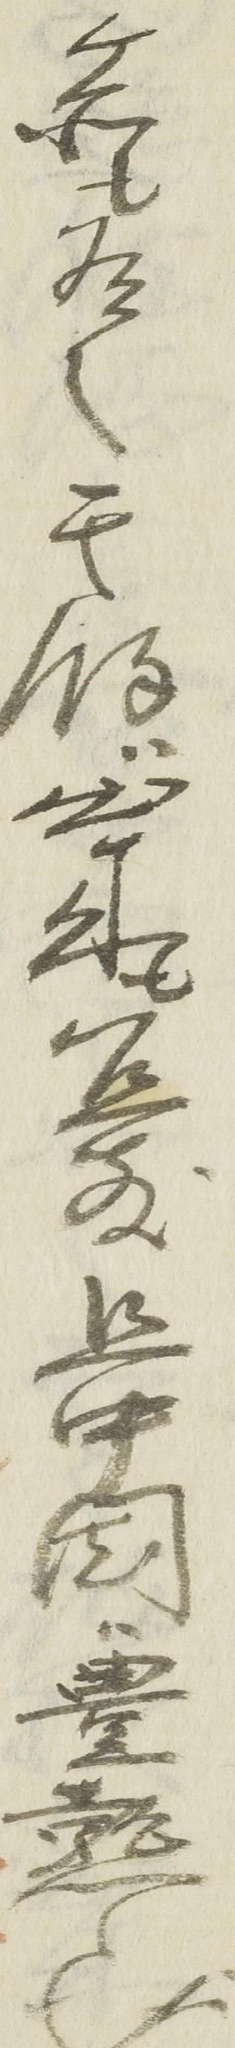ケ所も有之其余ハ出来も宜敷且中？ハ豊熟之趣
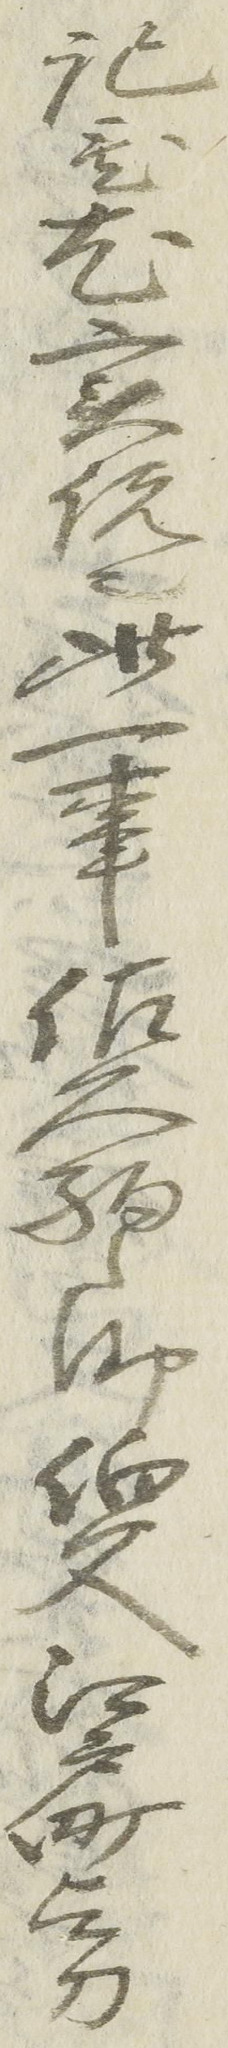記置尤実説ニ此一事佐久駒之助伯父江戸町与力
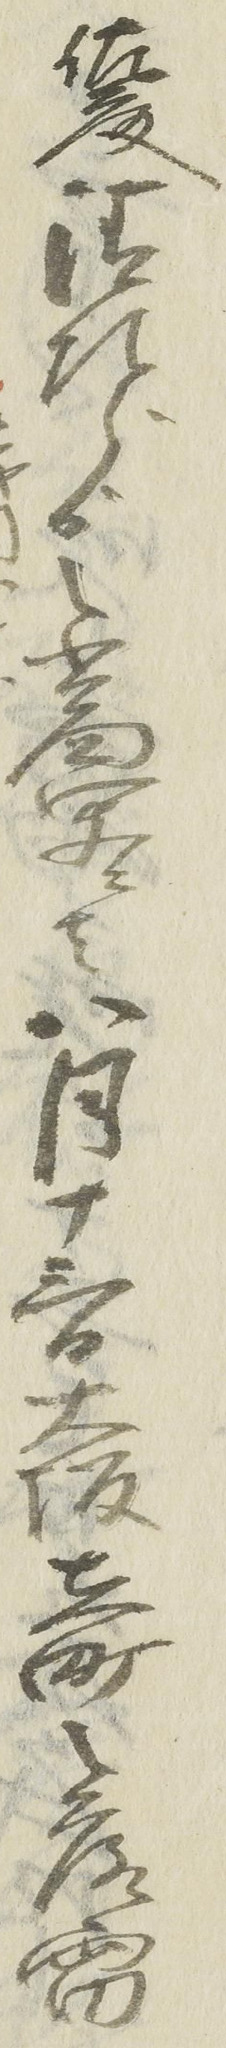佐藤清次郎ゟ之書面写ニは八月十三日大坂在町之落雷
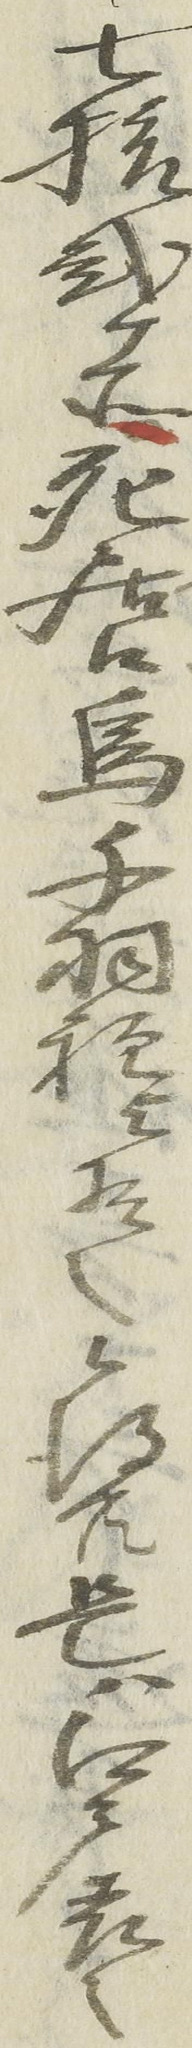七拾弐ケ所死居候烏千羽程と有之候得共是ハ江戸表之

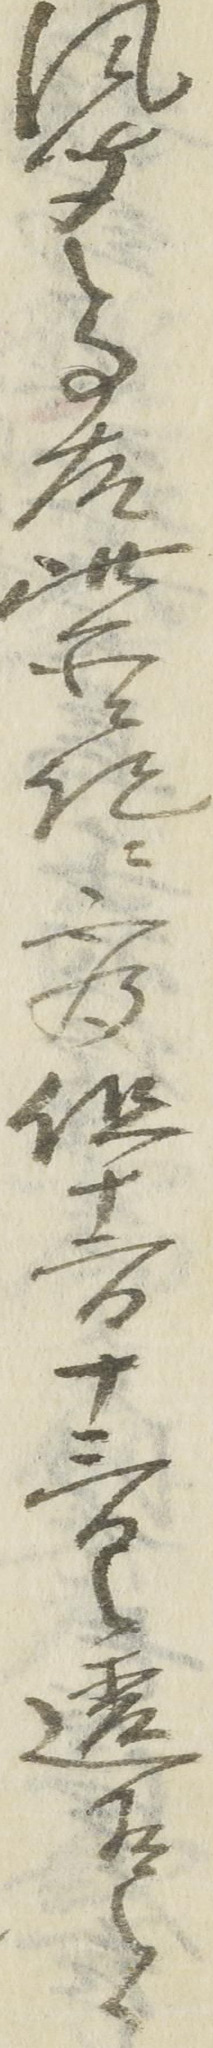風聞之事故此所ニ記ニ不及但十二日十三日之違有之候
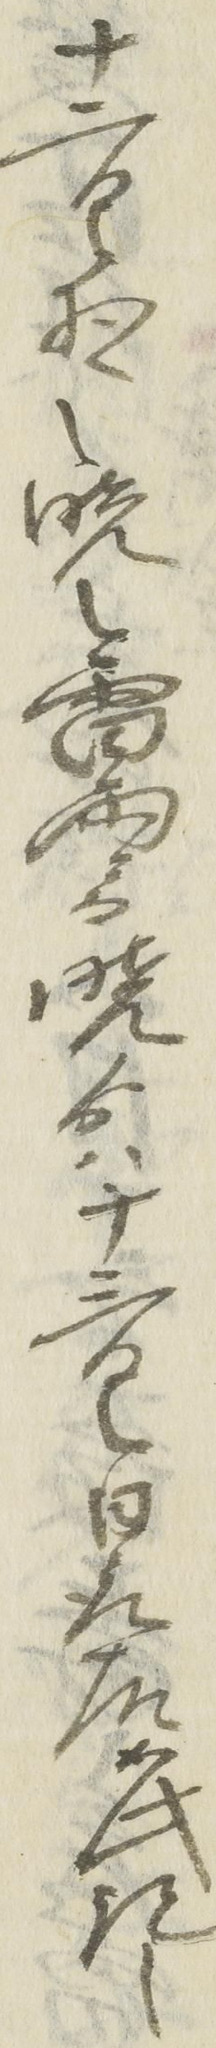十二日之夜之晩之雷雨ニ而暁ゟハ十三日之日取故如此記し
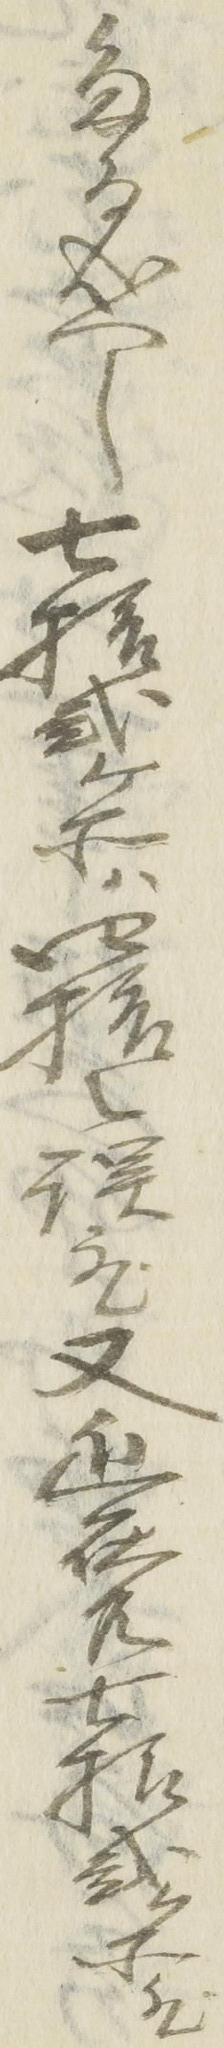たる成へし七拾弐ケ所ハ四拾之誤歟又近在共七拾弐ケ所歟
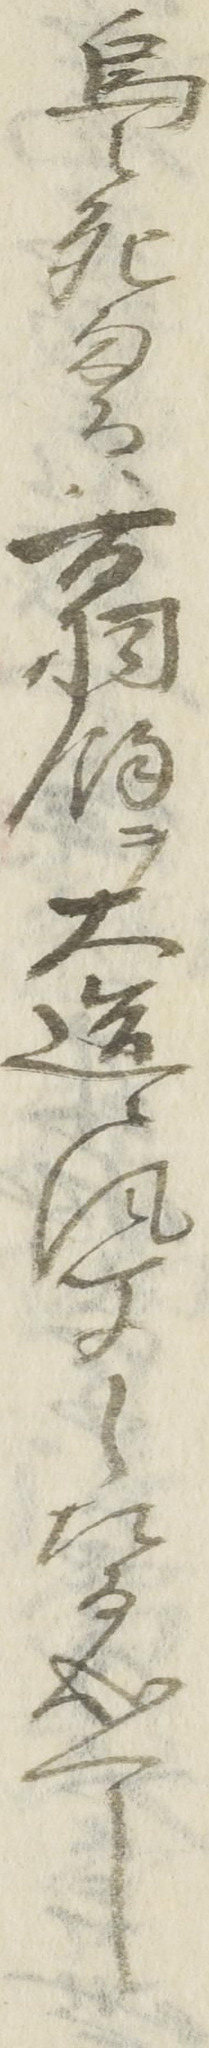烏之死たるハ百羽余ヲ大造二風丁したる成へし
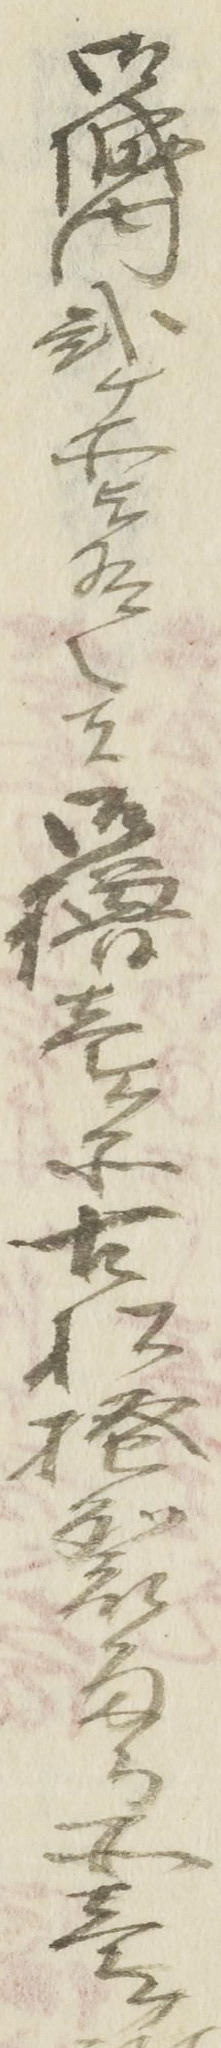御城内弐ケ所と有之は御櫓壱ケ所古松掻裂たる所壱ケ所
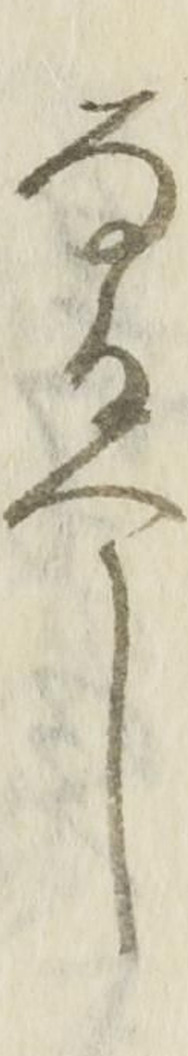なるへし
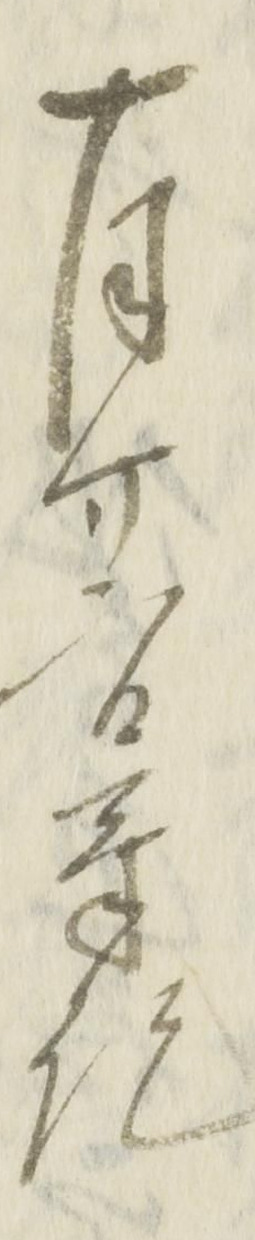十月廿二日筆記
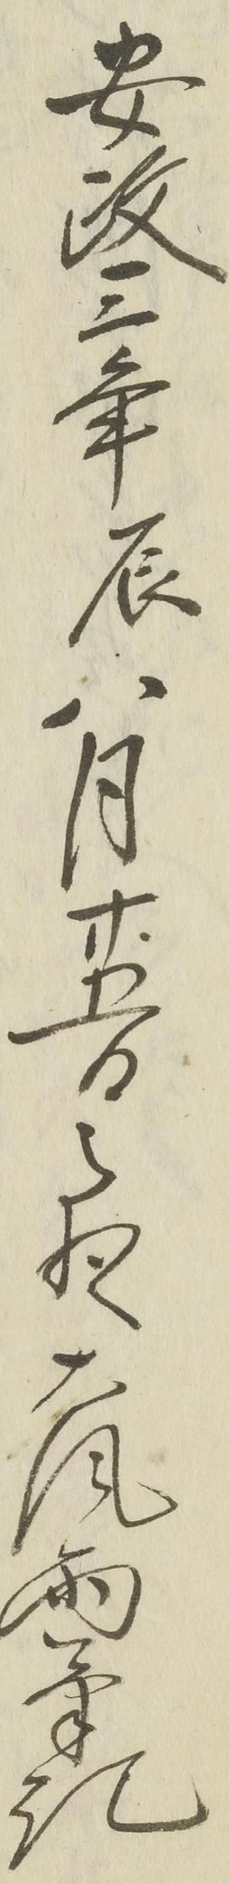安政三年辰八月廿五日之夜大風雨筆記
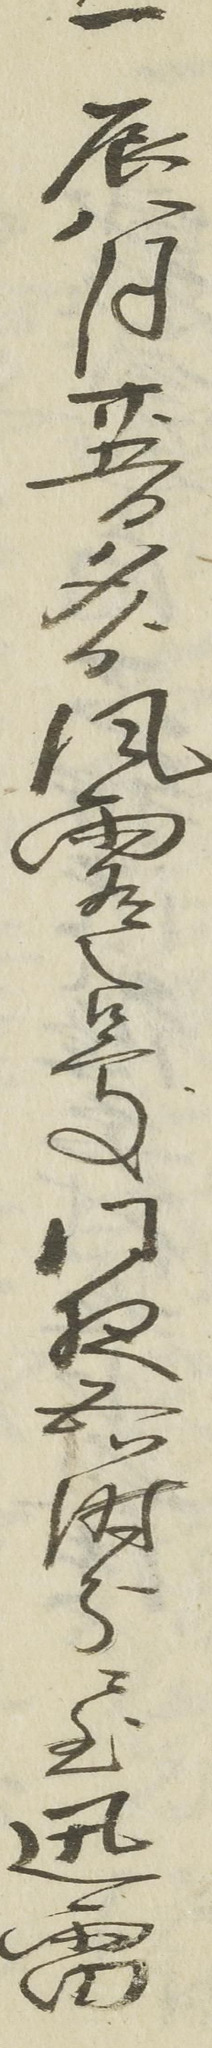一辰八月廿五日夕ゟ風雨有之候処同夜五つ時分に至迅雷
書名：安政乙卯江戸大地震筆記　安政丙辰八月大阪大雷雨之記追加　安政三辰年七月松前辺大地震并八月大風雨記録
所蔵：東京大学地震研究所図書室 Earthquake Research Institute Library, The University of Tokyo, JAPAN
